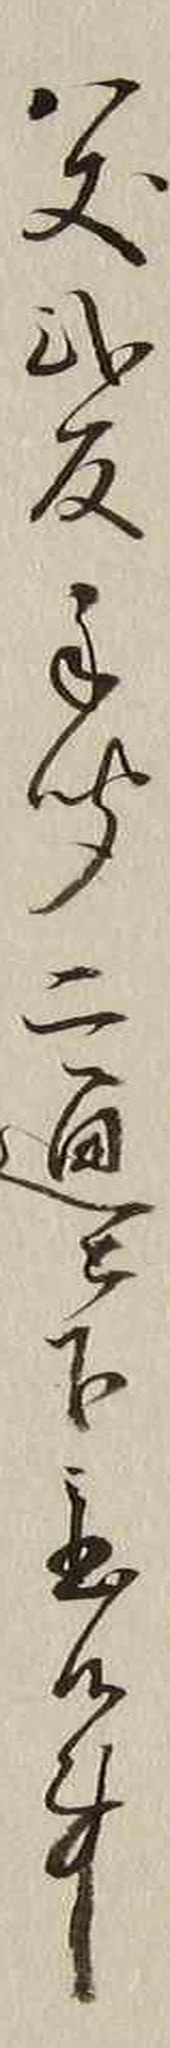八丈弐反手聞二通被下置候事
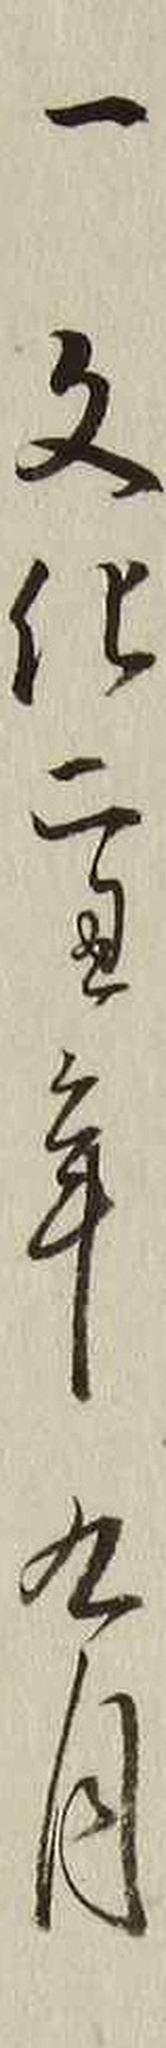一文化二丑年九月
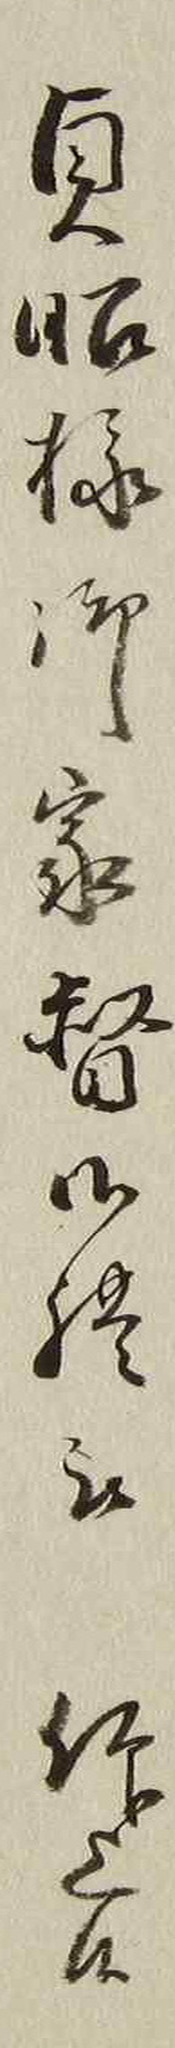貞昭様御家督御礼被仰上候
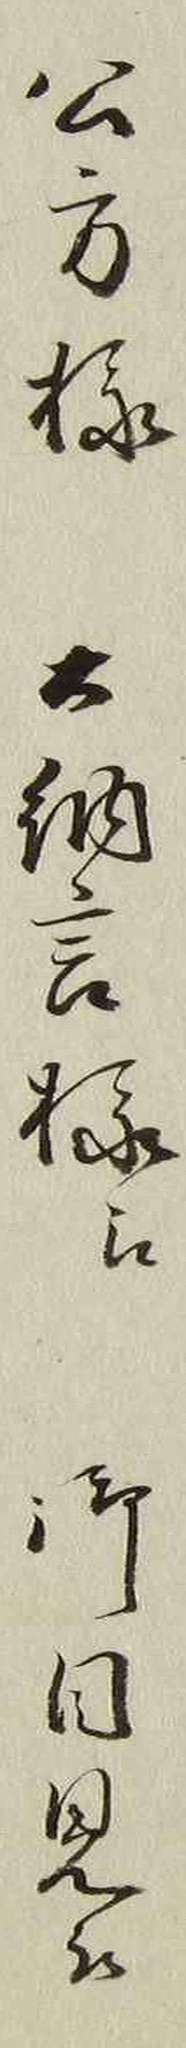公方様大納言様江御目見被
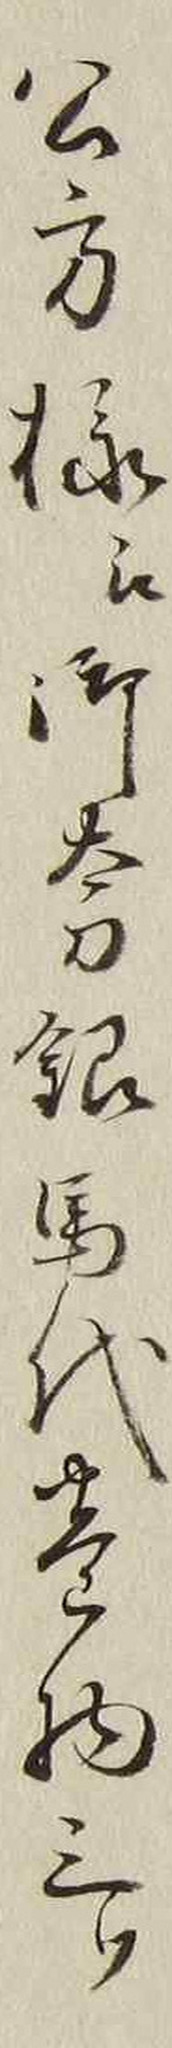公方様江御太刀銀馬代巻物三つ
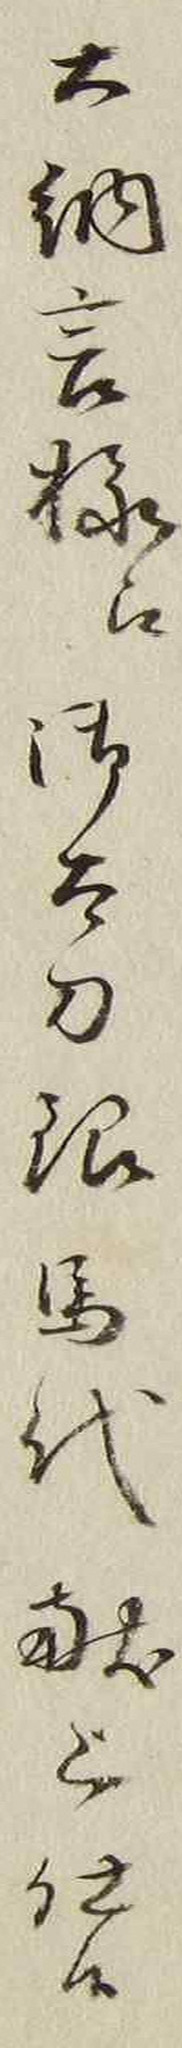大納言様江御太刀銀馬代献上仕候

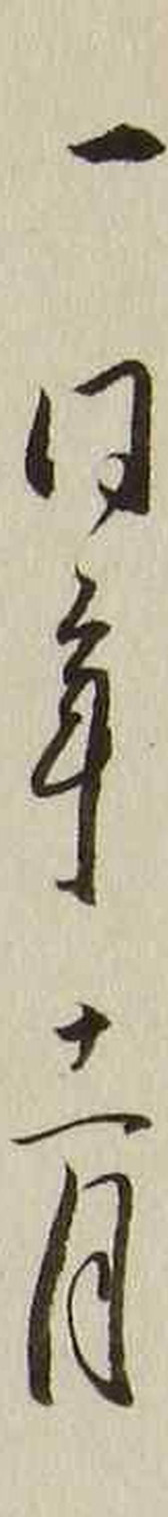一同年十一月
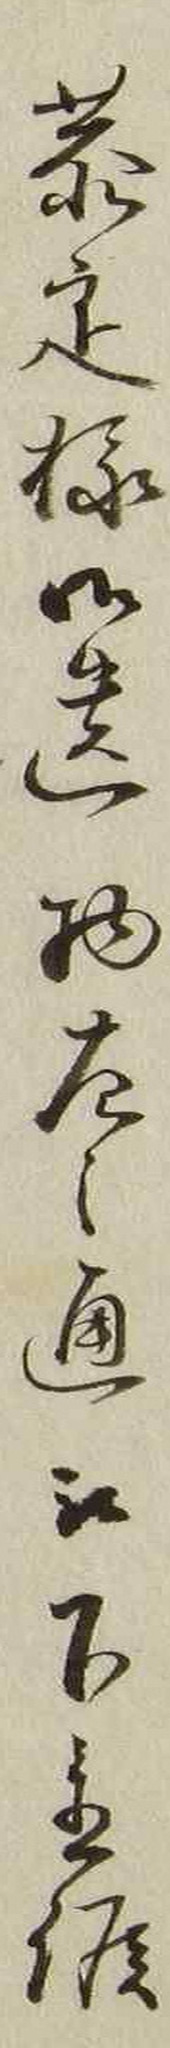恭定様御遺物左之通被下置候
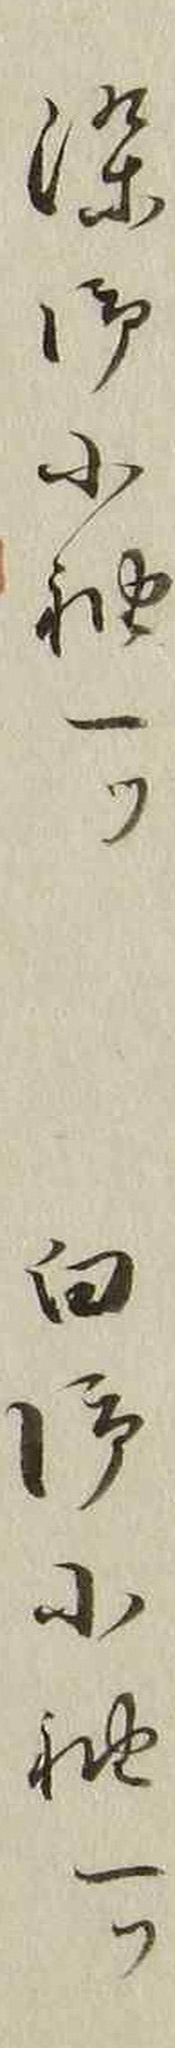染御小袖一つ白御小袖一つ
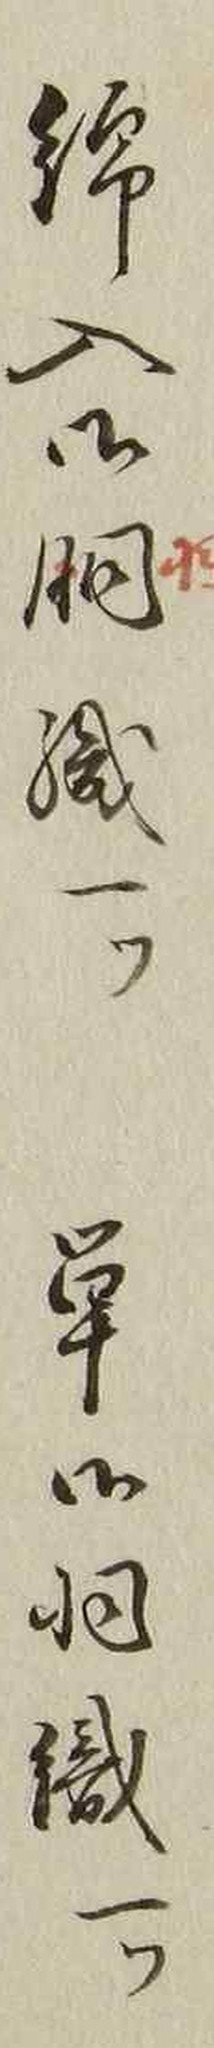綿入御胴織一つ単御羽織一つ
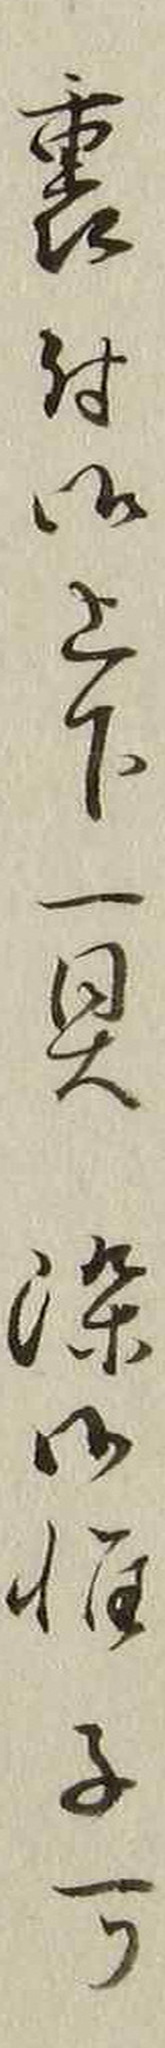裏付御上下一具染御帷子一つ
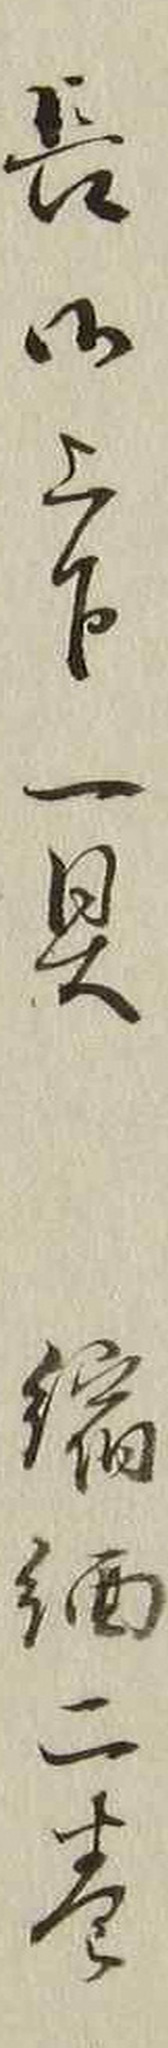長御上下一貝縮緬二巻
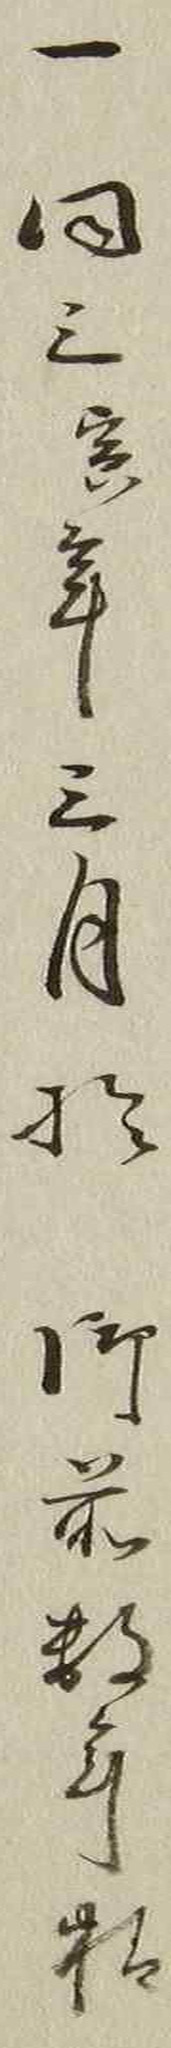一同三寅年三月於御前数年精
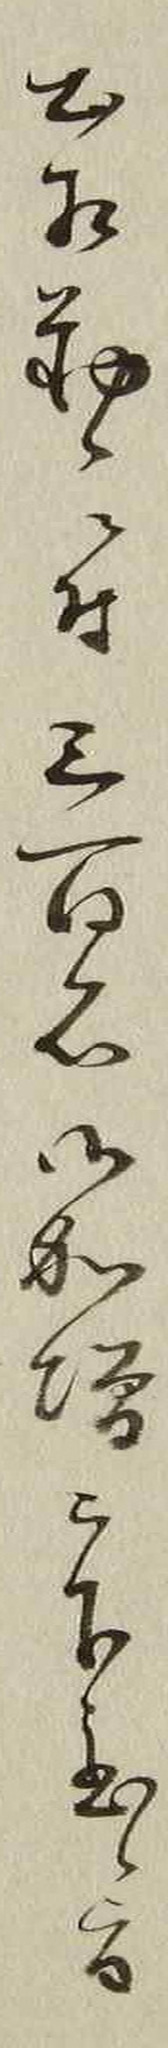出相勤候に付三百石御加増被下置候旨
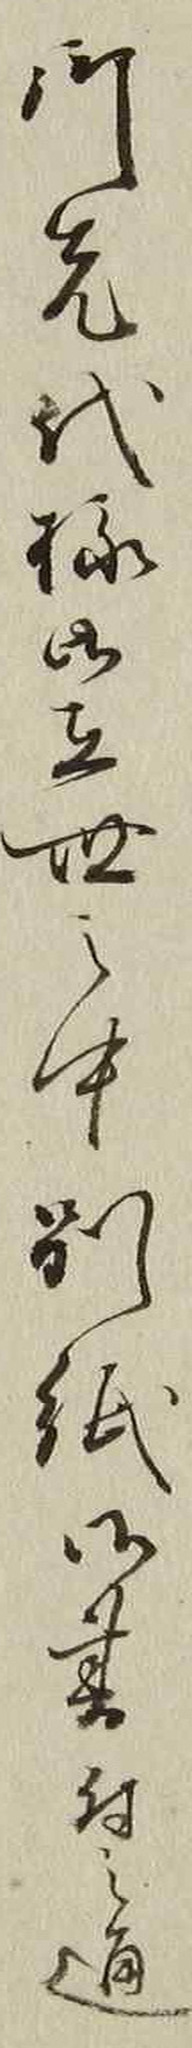御先代様御在世之中別紙御書付之通
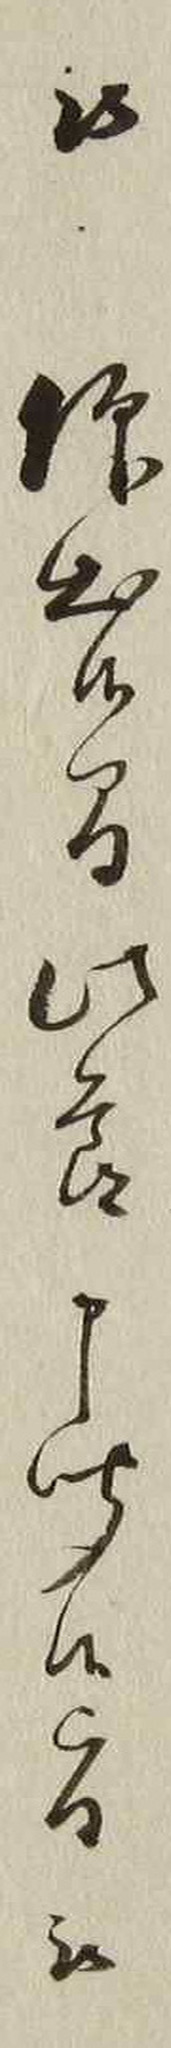仰出候間此節申聞候旨被
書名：諸士系譜　巻之159　な之部1
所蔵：会津若松市立会津図書館
